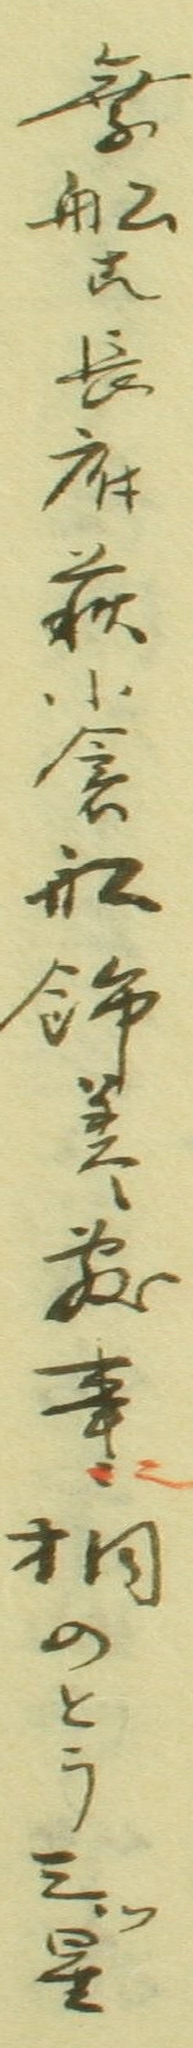乗船す長府萩小倉船飾美々敷事也桐のとう三ツ星
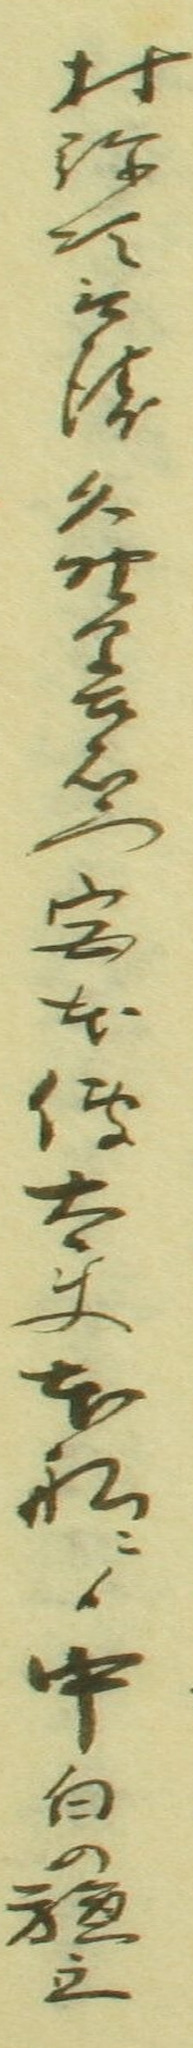村弥次兵衛久野善右衛門宮本傳太夫本船に中白の籏立
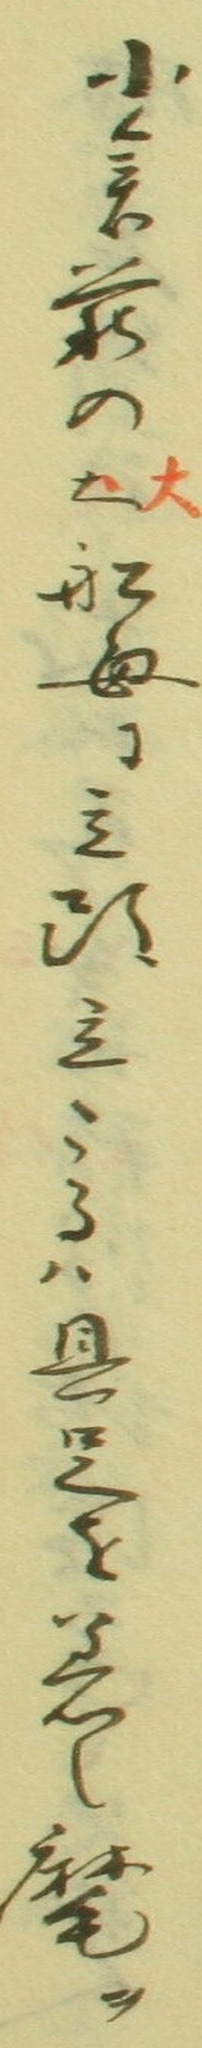小倉前の大船毎に立頭立たるは具足を着し麾ヲ

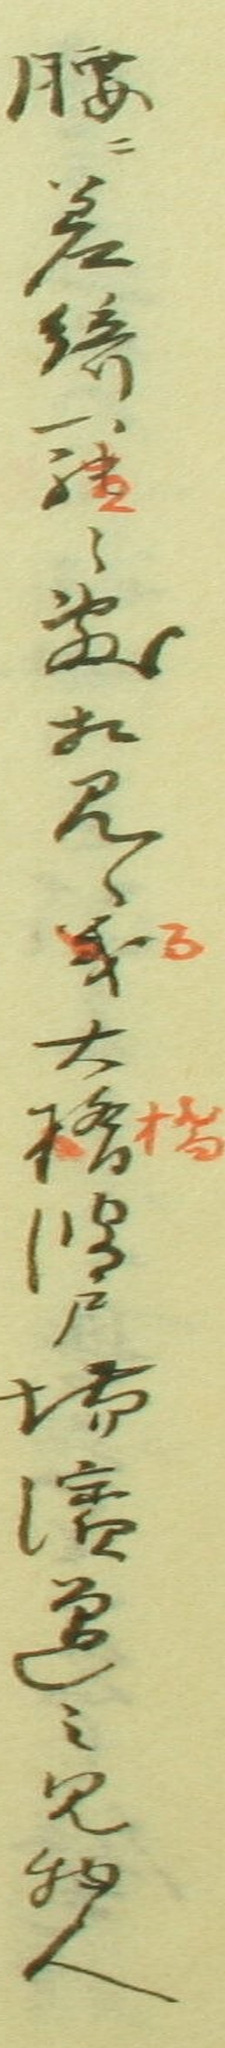腰ニ差綺羅々敷相見へ而大橋波戸場浜辺之見物人
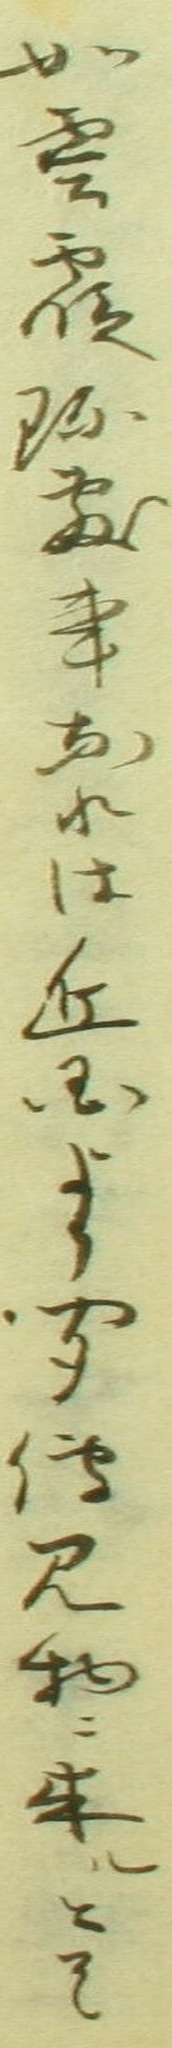如雲霞珎敷事なれは近国より聞伝見物ニ来るとそ
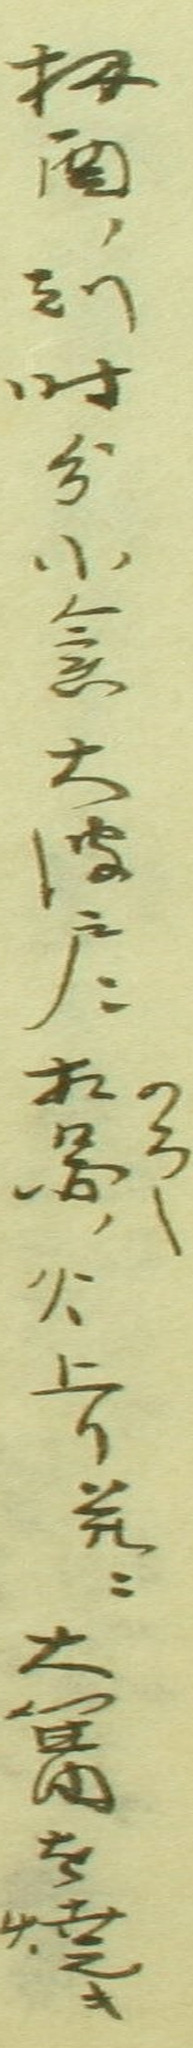扨酉ノ刻時分小倉大波戸ニ相図ノ火上り幷ニ大篝を焼キ
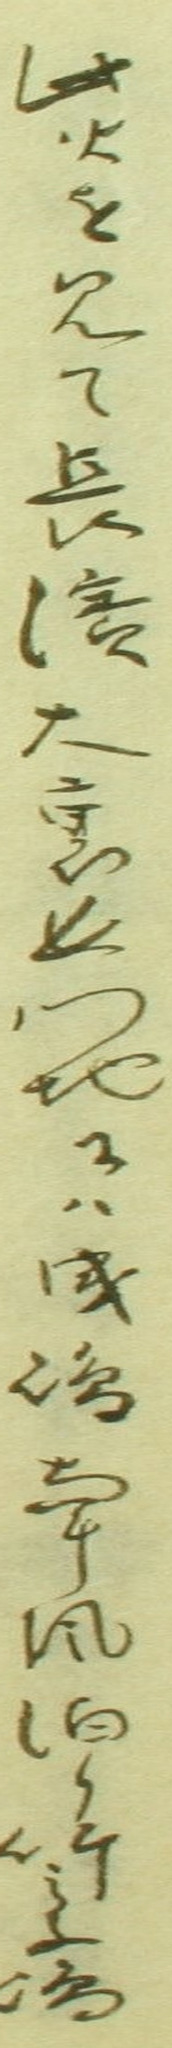此火を見て長浜大裏長門地には成島南風泊り竹之子島
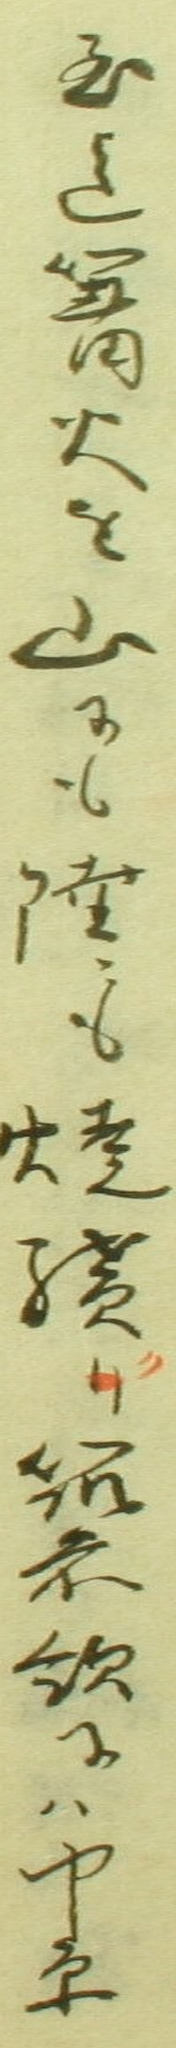至迄篝火を山にも陸にも焼続く筑前領には中原
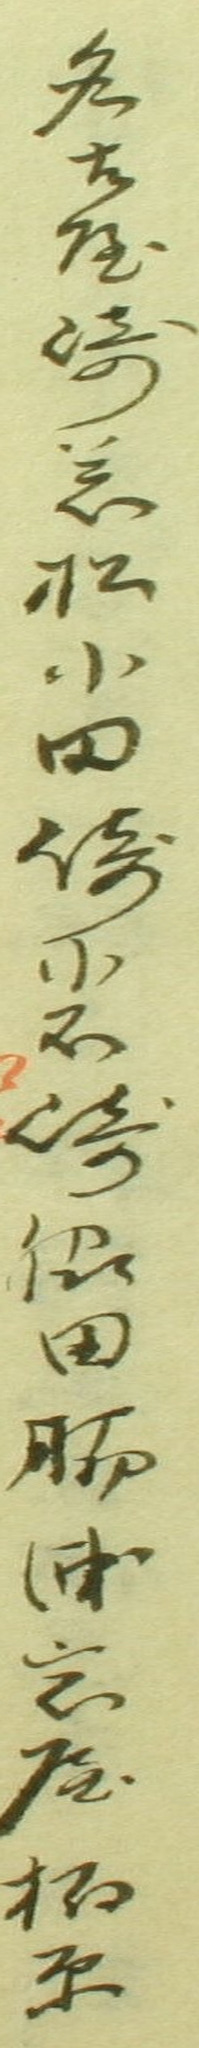名古屋崎若松小田崎小石崎脇田脇浦岩屋柏原
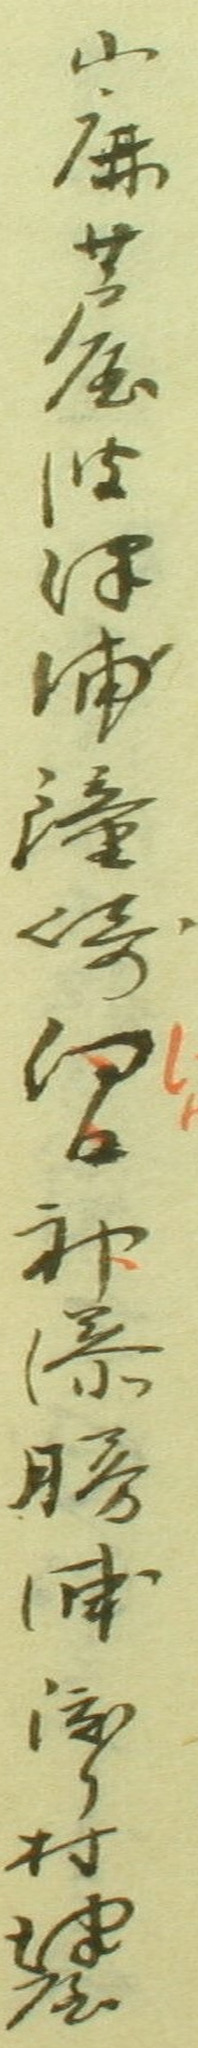山鹿芦屋波津浦鐘崎江口神添勝浦渡り村津屋
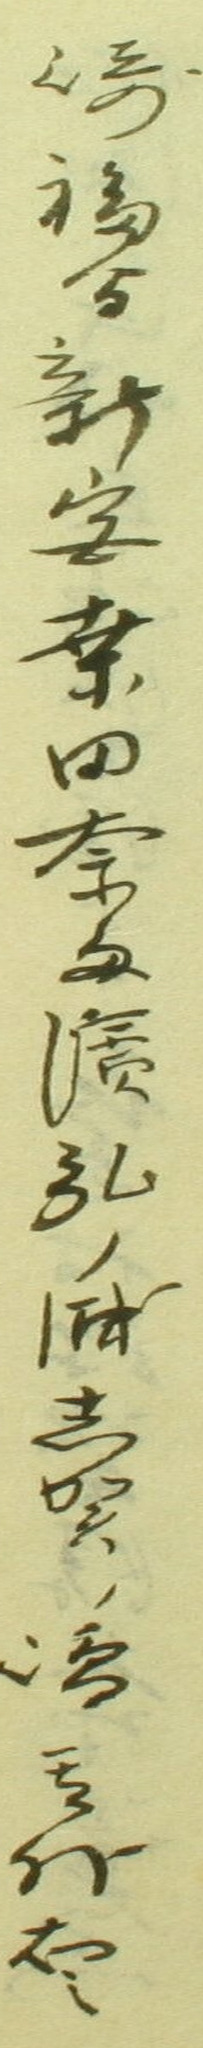崎福新宮幸田奈多浜弘ノ浦志賀ノ島其外右之
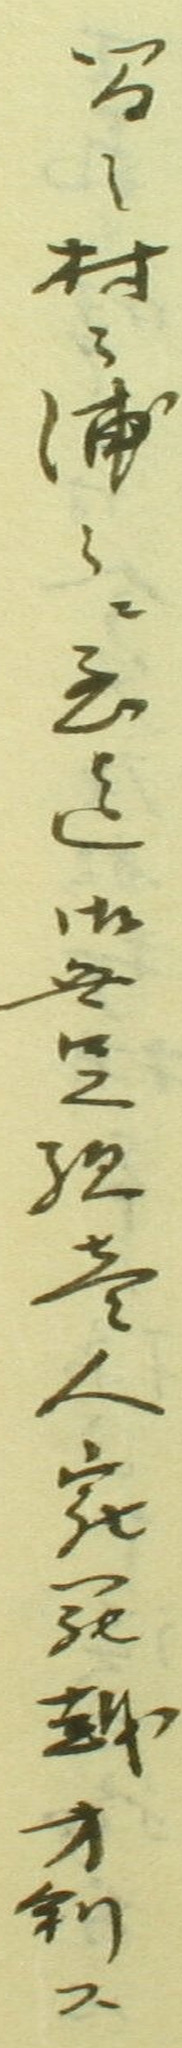間之村々浦々ニ至迄御無足頭壱人宛罷越才判ス
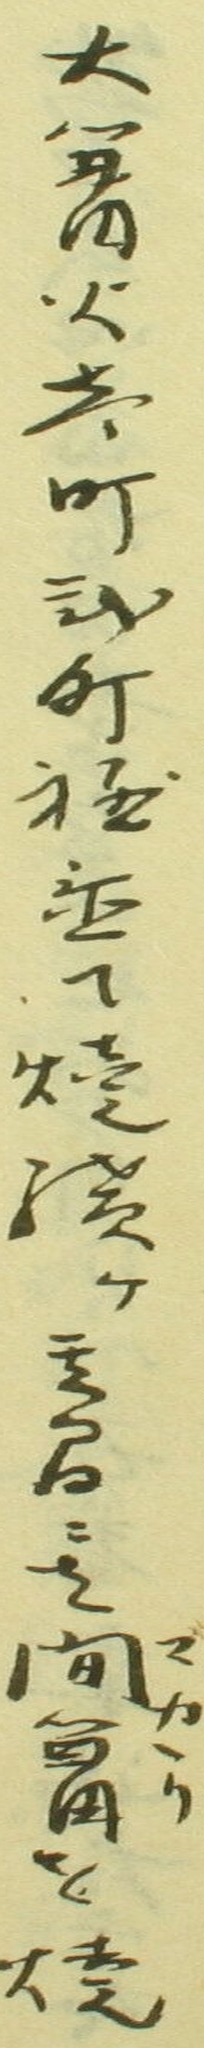大篝火壱町弐町程置て焼続ケ其間には間篝を焼
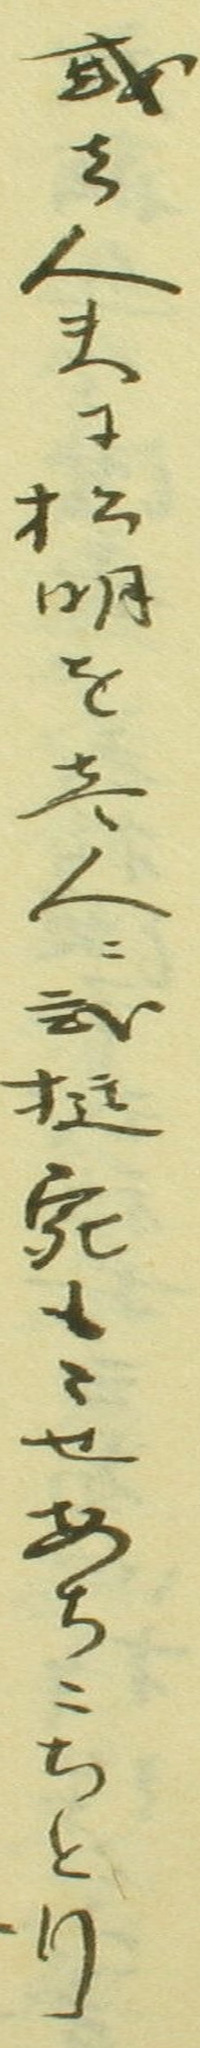或は人夫に松明を壱人ニ弐挺宛もたせあちこちと行
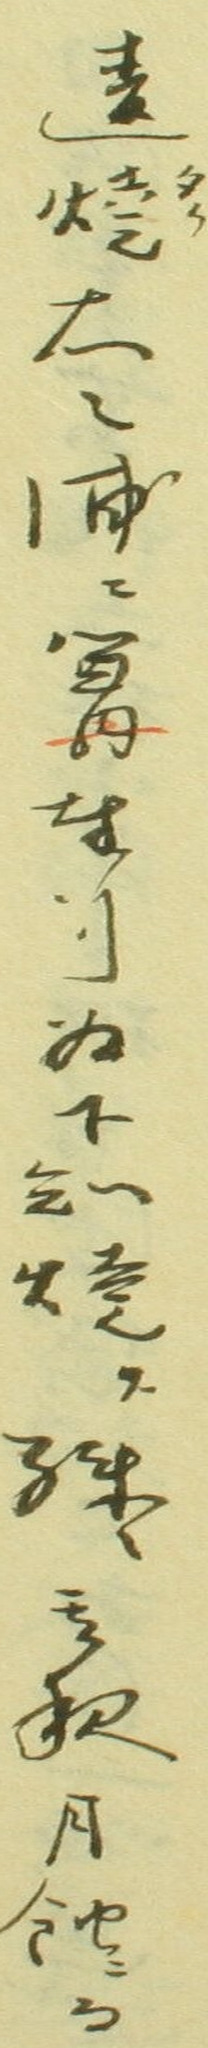違焼右之浦ニ篝奉行為下知焼ス殊ニ其夜月蝕ニ而
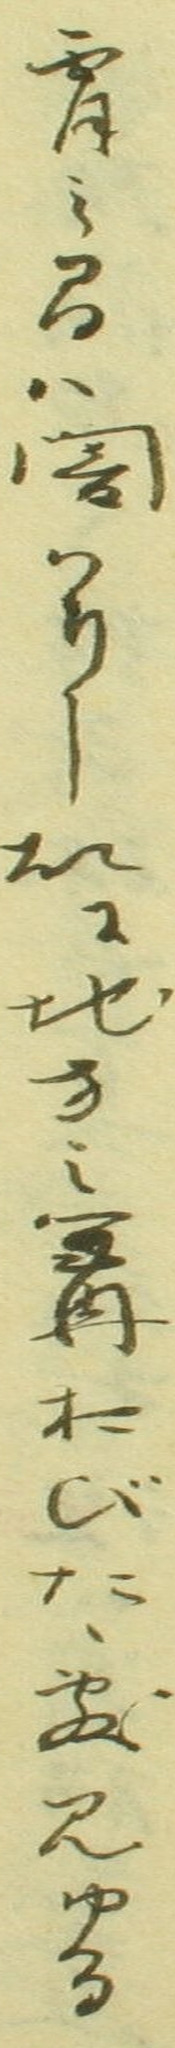宵之間は闇かりし故に地方之篝おびたゝ敷見ゆる
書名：唐船漂流記 二
